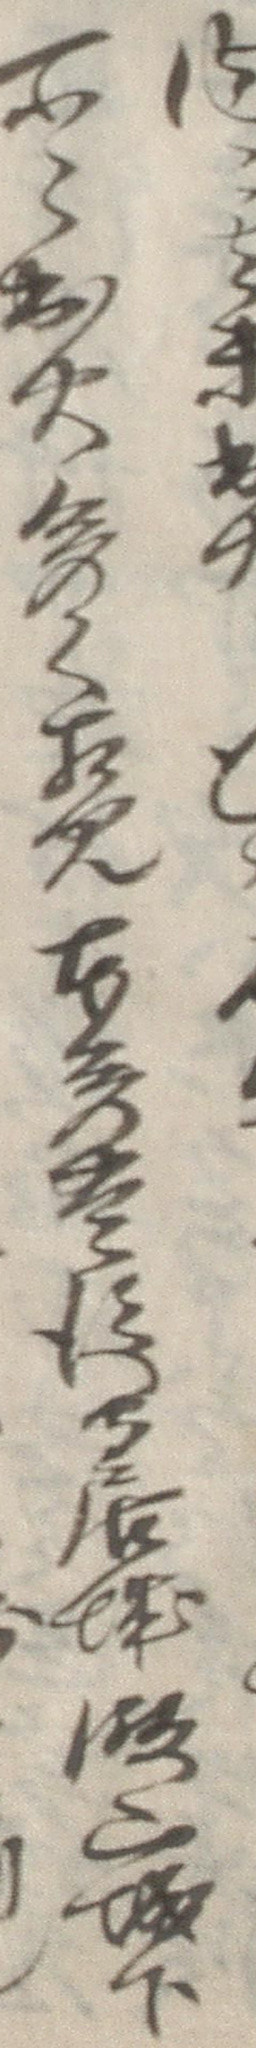所々出火多く相見本多豊後守居城飯山城下
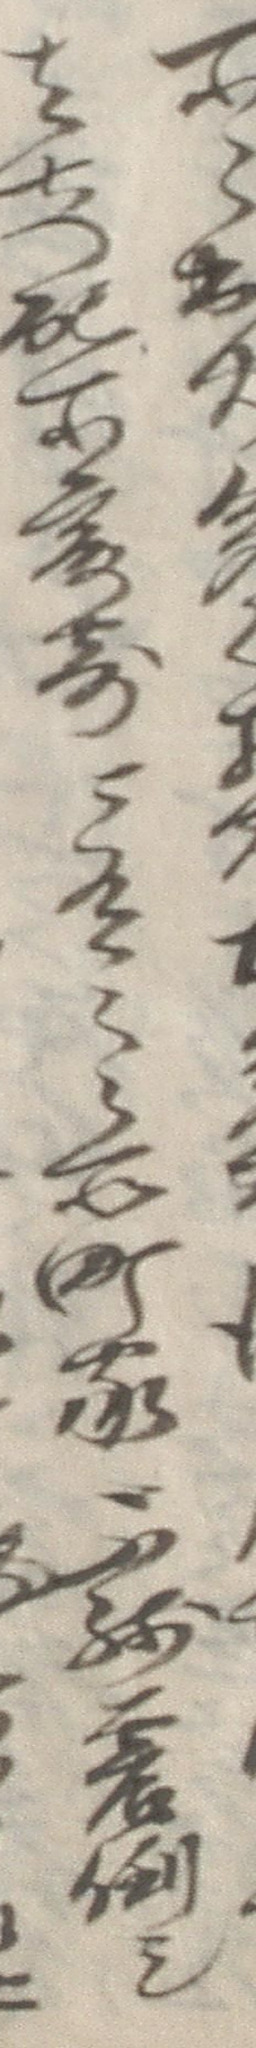は支配所最寄二有之候所町屋不残震倒ㇱ
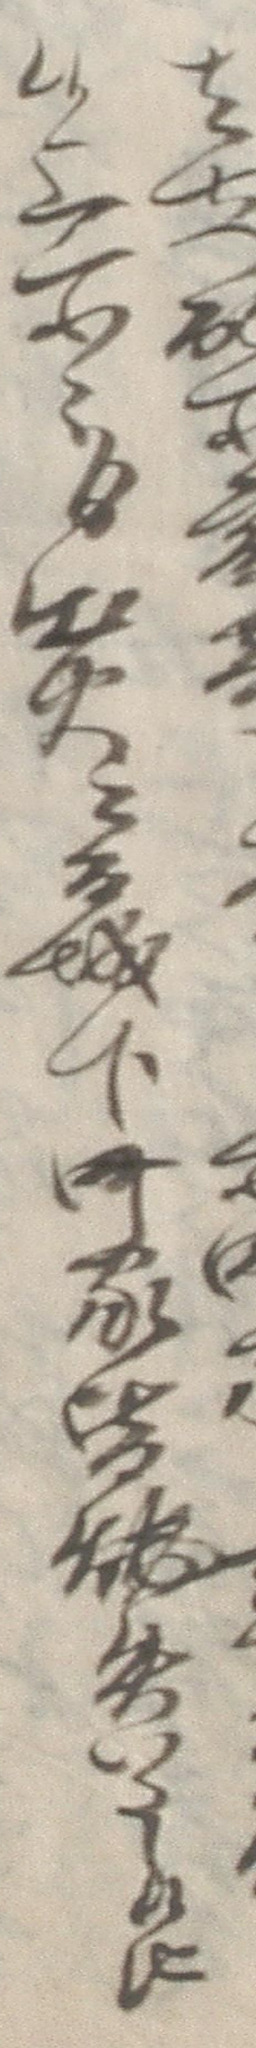候上所々ゟ出火二而城下町家皆焼失いたし候由
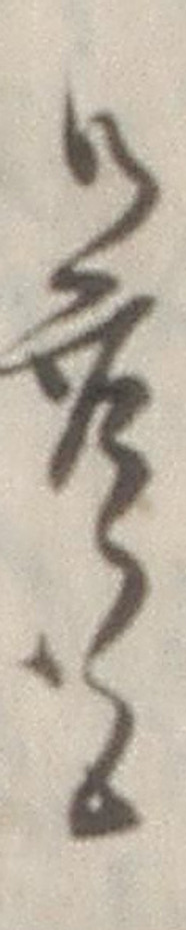御座候以上
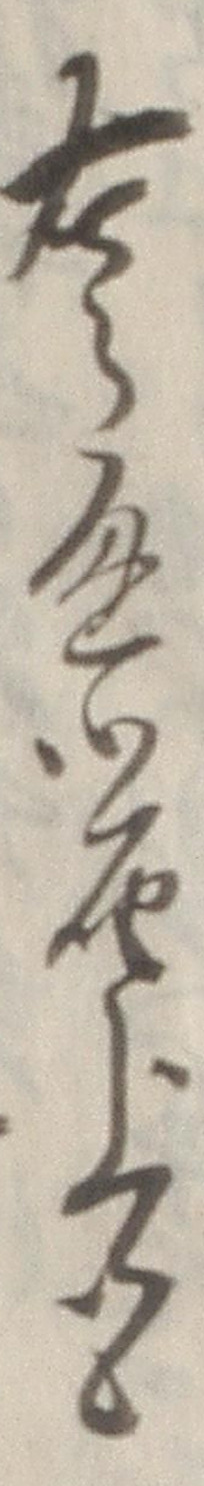右之通可御届申上候以上
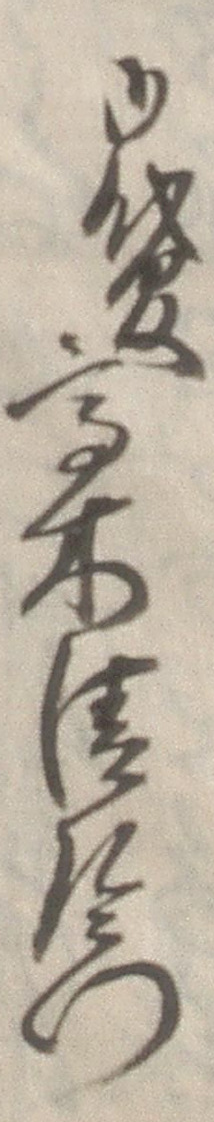高木清左衛門
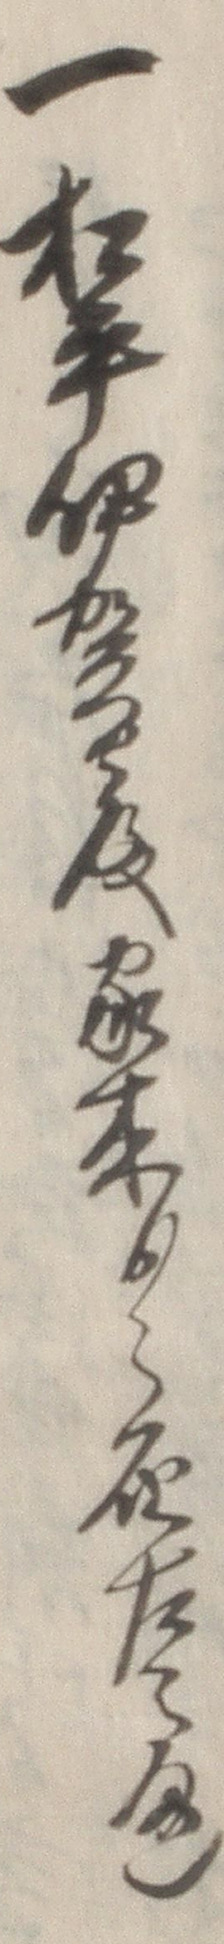一松平伊賀守殿家来ゟ之届左之通
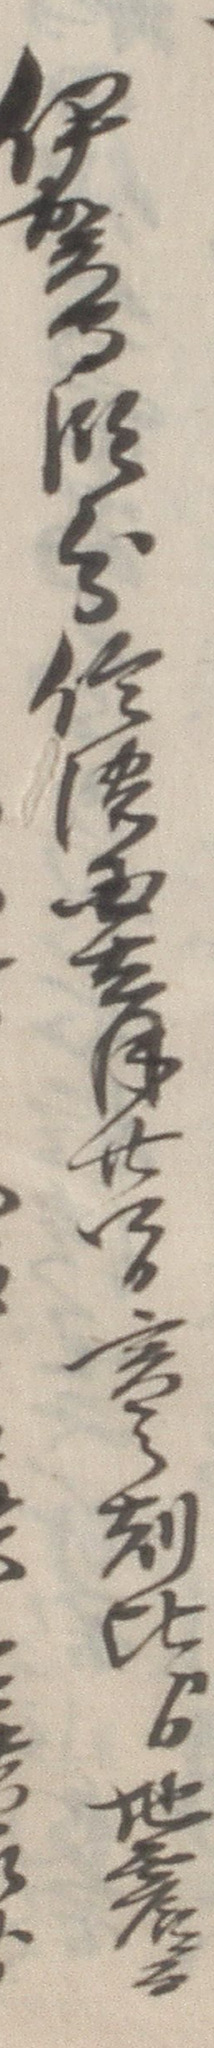伊賀守領分信濃国去月廿四日亥之刻比ゟ地震二而
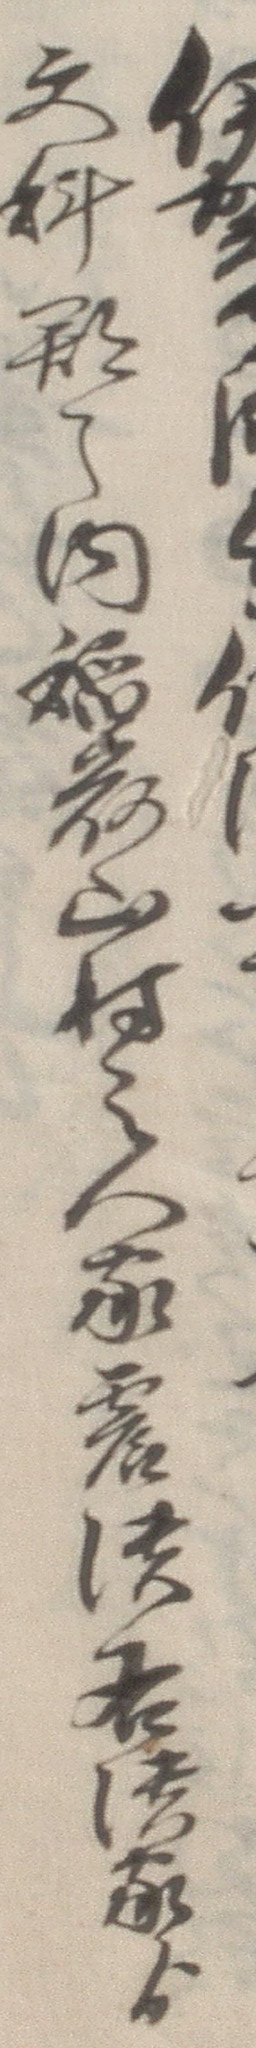更級郡之内稲荷山村之人家震潰右潰家ゟ
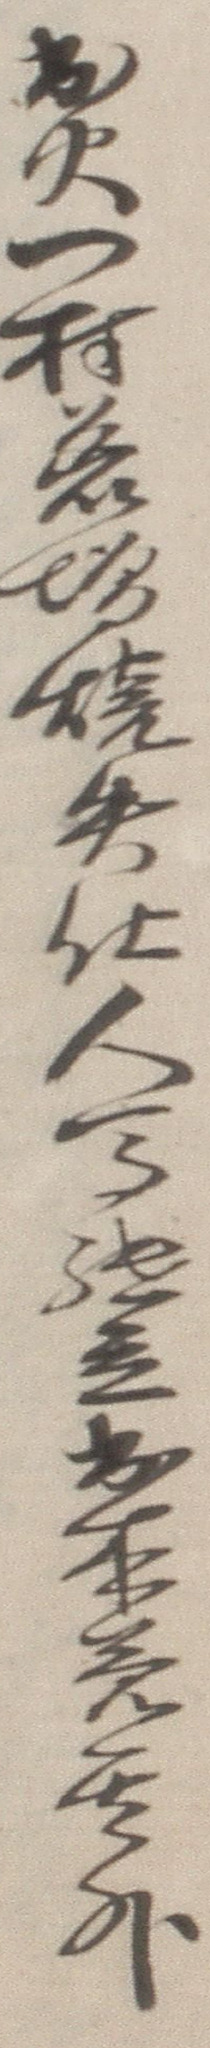出火一村荒増焼失仕人馬継立出来兼其外
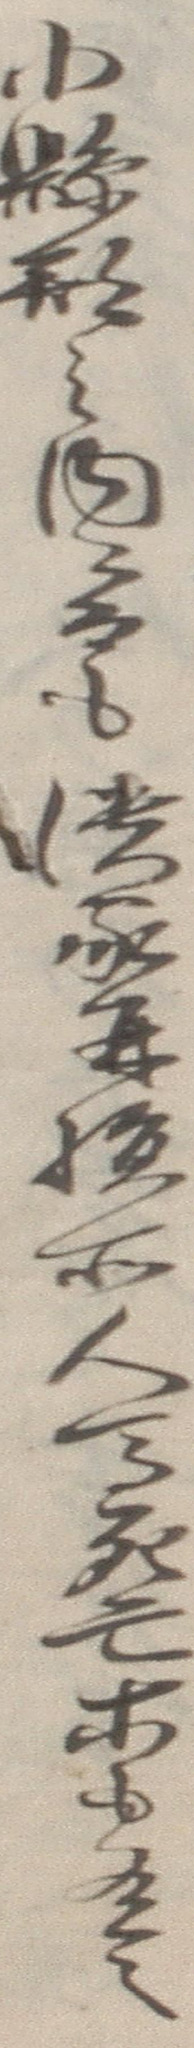小県郡之内二而も潰家并損所人馬死亡等も有之
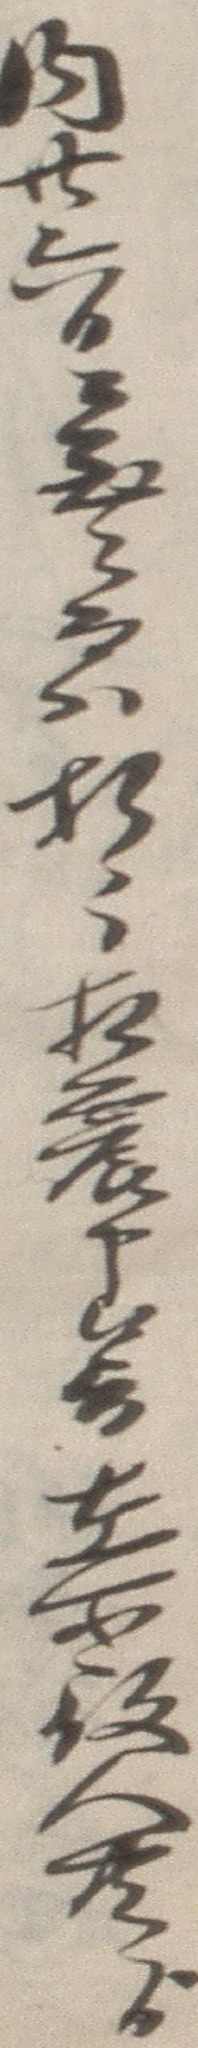内廿六日二至候而ハ折々相震申旨在所役人共ゟ
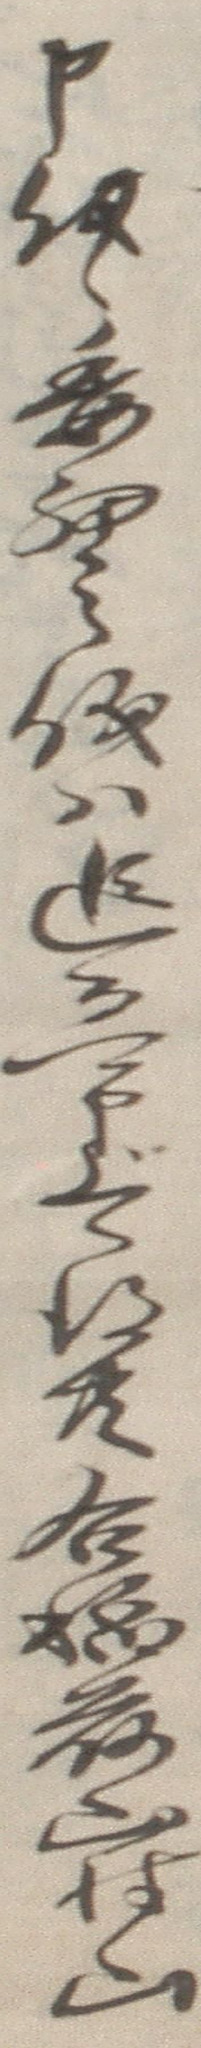申越候委細之儀ハ追而可申上候得共右稲荷山村山
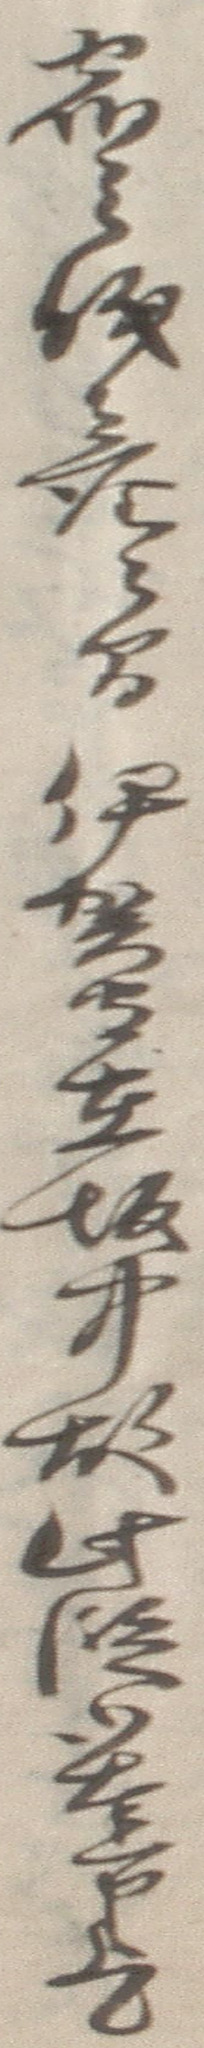宿之儀御座候間伊賀守在坂中故此段御在所可申上候
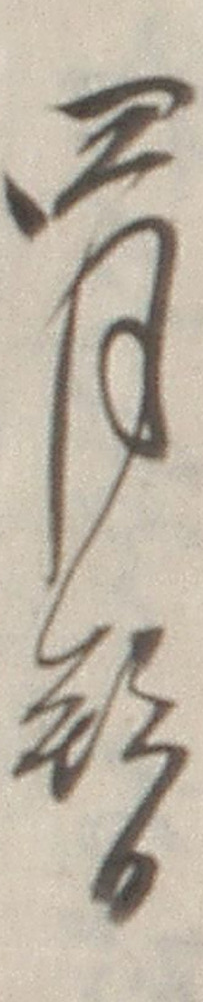四月朔日
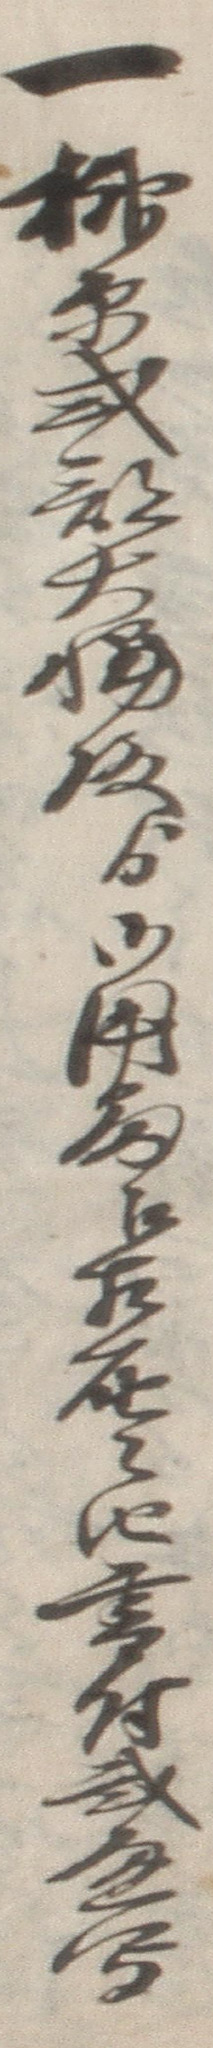一榊原式部大輔殿ゟ御用番江相届候由書付弐通写
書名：信州地震一件
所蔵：東京大学地震研究所図書室 Earthquake Research Institute Library, The University of Tokyo, JAPAN
